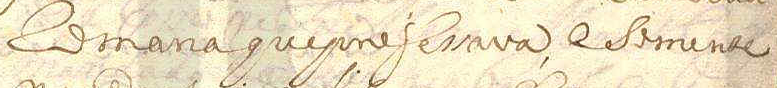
Romana que professava, e Somente
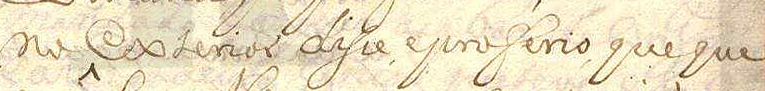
no Exterior disse, e proferio, que que
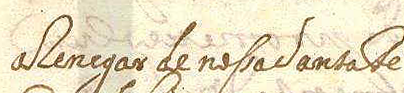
aRenegar de nossa Santa Fé
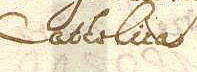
Catholica
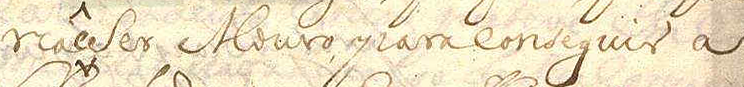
ria e Ser Mouro, para conseguir a
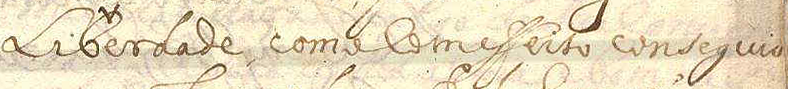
Liberdade, como Com effeito conseguio
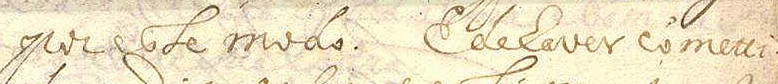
por este modo. E de haver cometti
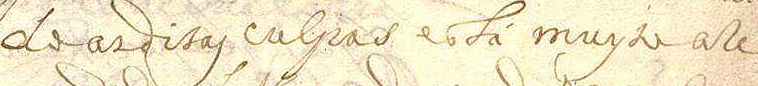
do as ditas culpas está muyto aRe
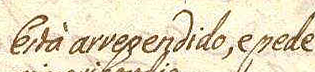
Está arrependido, e pede
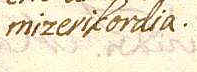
mizericordia.
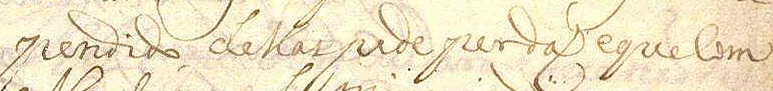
pendido, dellas pede perdaõ e que Com
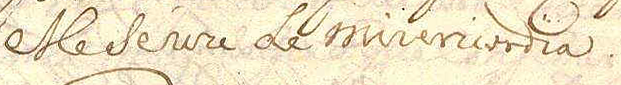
elle se uze de mizericordia
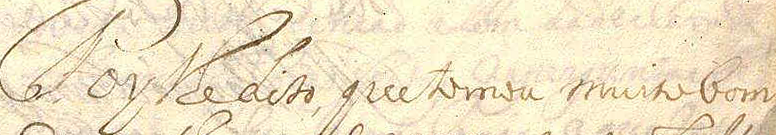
Foy lhe dito, que tomou muito bom
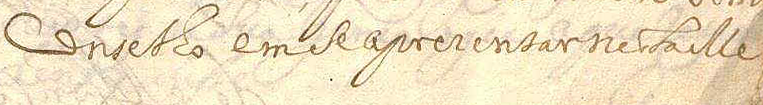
Conselho em se aprezentar nesta Me
